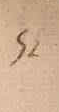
52
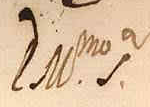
EM.mo S.or
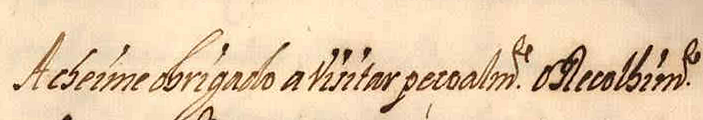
Acheime obrigado a Visitar peçoalm.te o Recolhim.to
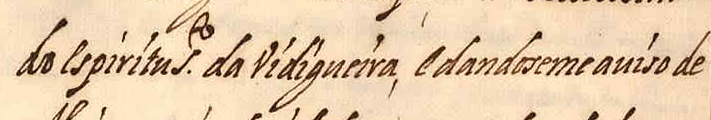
do espiritu s.to da Vidigueira, e dandoseme auiso de
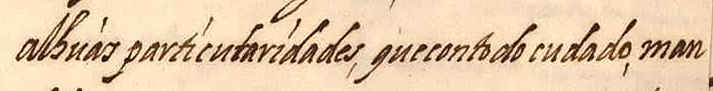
alhuās particularidades, que con todo cudado, man
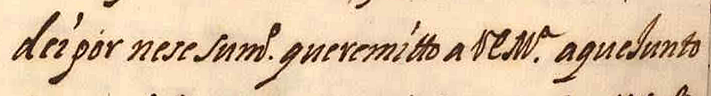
dei por nese sum.o que remitto a V EM.a a que Iunto
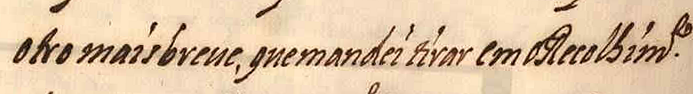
otro mais breue, que mandei tirar em o Recolhim.to
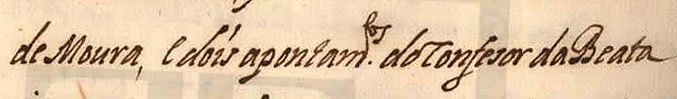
de Moura, e dois apontam.tos do Confesor da Beata
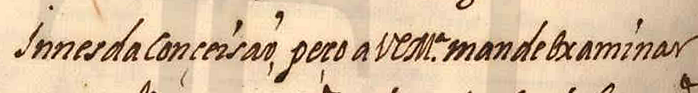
Innes da Conceisaõ, peço a V EM.a mande examinar
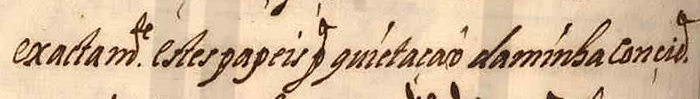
exactam.te estes papeis pa quietaçaõ da minha Concie.a
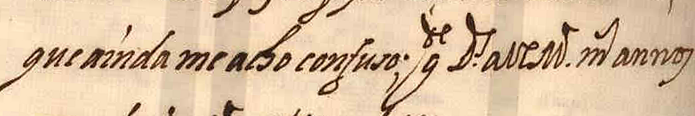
que ainda me acho confuso; gde D.s a V EM.a m̄ annos
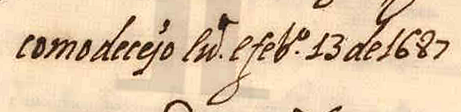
como decejo Eu.a e feb.o 13 de 1687
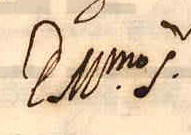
EM.mo S.or
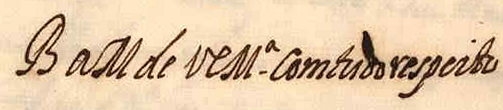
B a M de V EM.a com tudo respeito
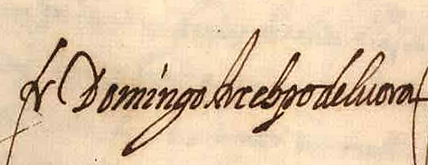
fr. Domingo Arcebpo de Euora
